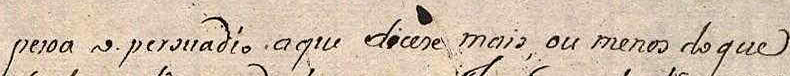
pesoa o persuadio a que dicese mais, ou menos do que
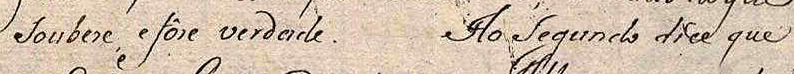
soubese, e fôse verdade. Ao segundo dice que
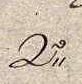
2o
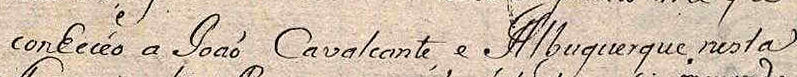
conhecéo a Ioaõ Cavalcante, e Albuquerque nesta
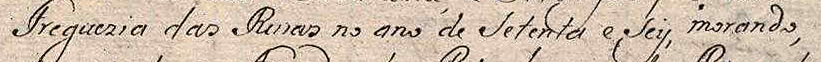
Freguezia das Rusas no ano de Setenta e seis, morando,
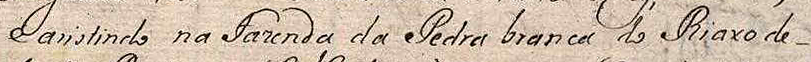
e asistindo na Fazenda da Pedra branca do Riaxo de
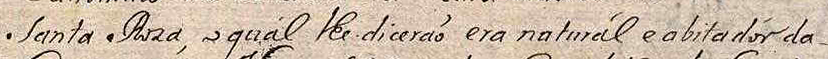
Santa Roza, o qual lhe diceraõ era natural e abitador da
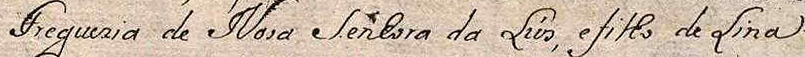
Freguezia de Nosa Senhora da Lús, e filho de Lina
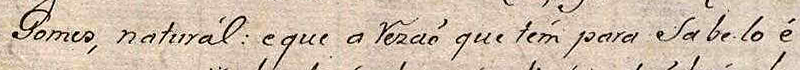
Gomes, naturál: e que a Rezaõ que tem para sabelo é
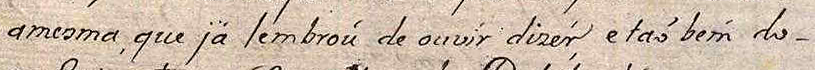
a mesma, que ja lembrou de ouvir dizer, e taõbem do
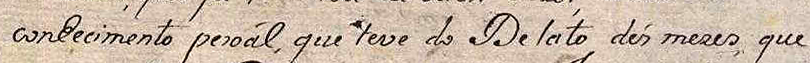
conhecimento pesoal, que teve do Delato dés mezes, que
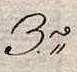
3.o
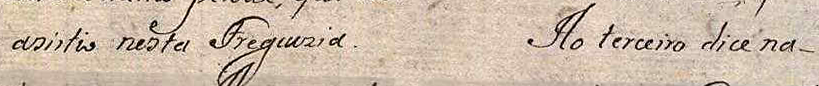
asistio nesta Freguezia. Ao terceiro dice na
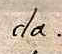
da.
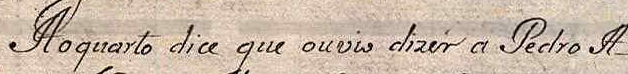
Ao quarto dice que ouvio dizer a Pedro A
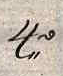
4o
